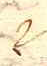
2
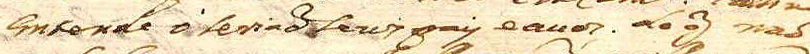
Entende o seriaõ seus pais e auos. do q̄ naõ
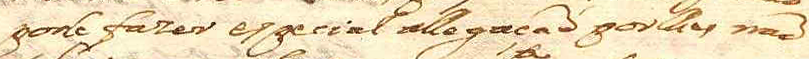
pode fazer especial allegaçaõ por lhes naõ
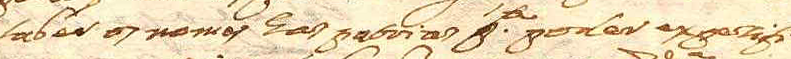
saber os nomes E as patrias p.a poder expesifi
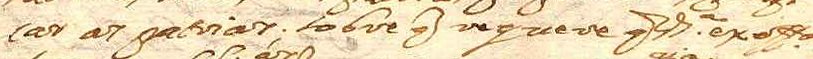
car as patrias, sobre q̄ requere q̄ Vs.a ex off.o
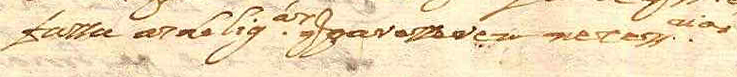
fassa as delig.as q̄ paresserem necess.rias
